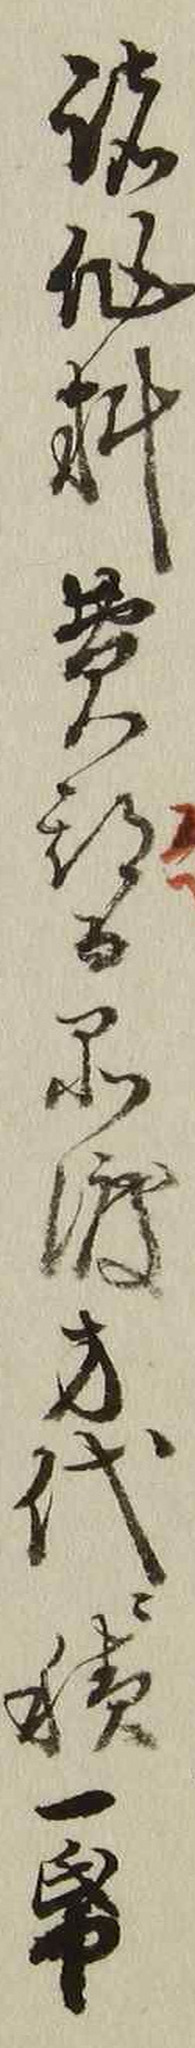諸作料費都而品渡方代ニ積一紙
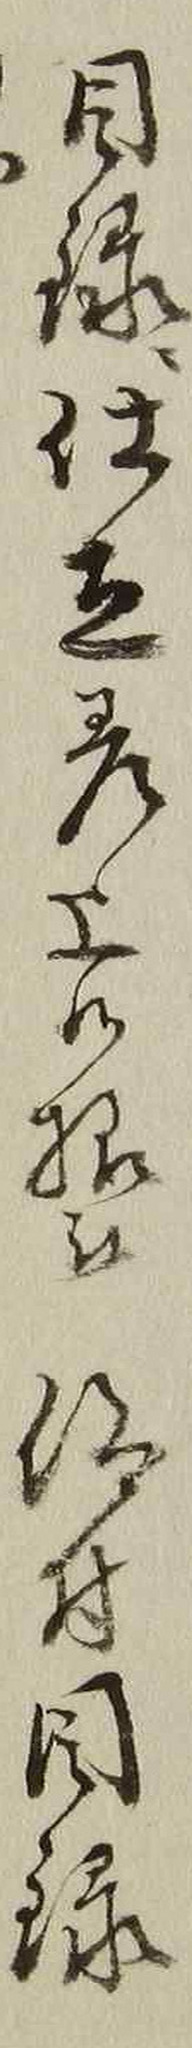目録ニ仕立差上候様被仰付目録
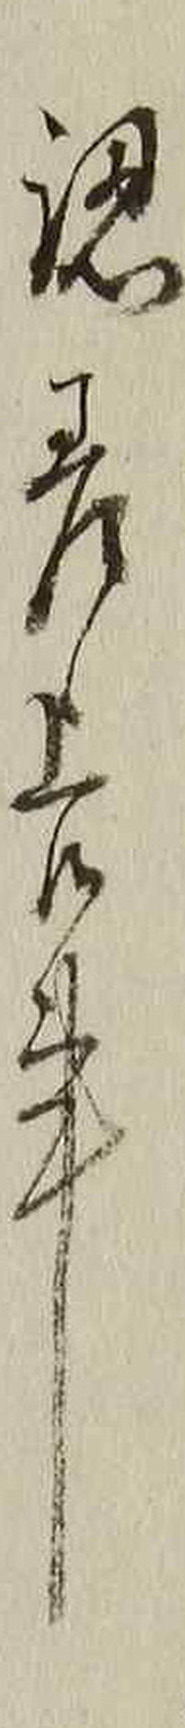認差上候事
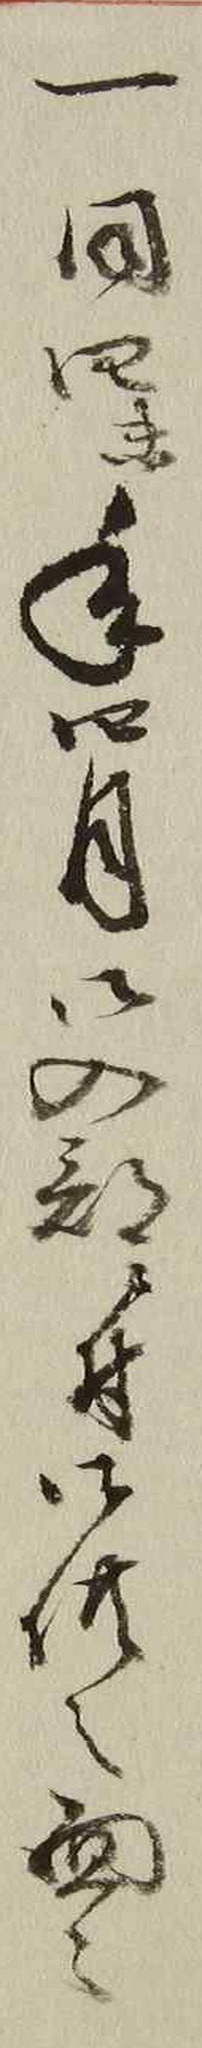一同四未年四月御入部ニ付御供之面々
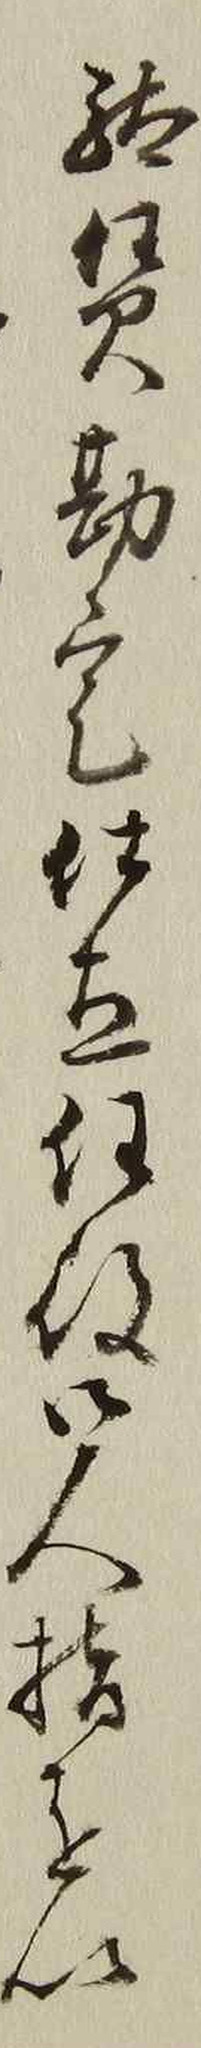駄賃勘定仕立任役御人指を以
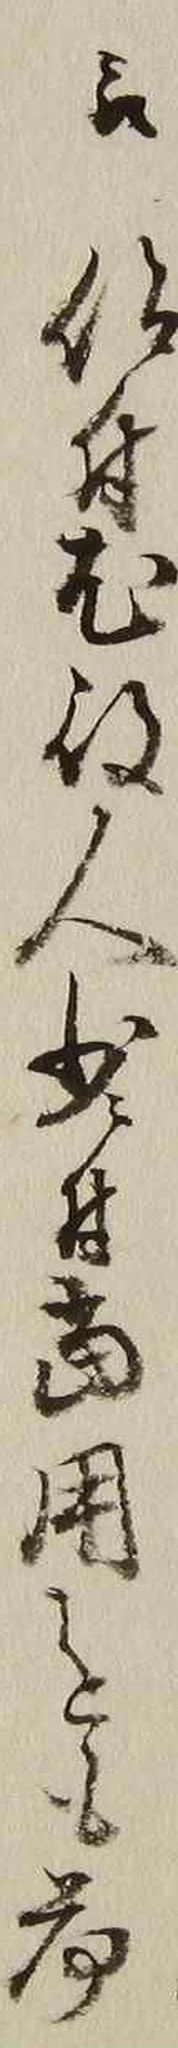被仰付尤役人少ニ付当用をも荷
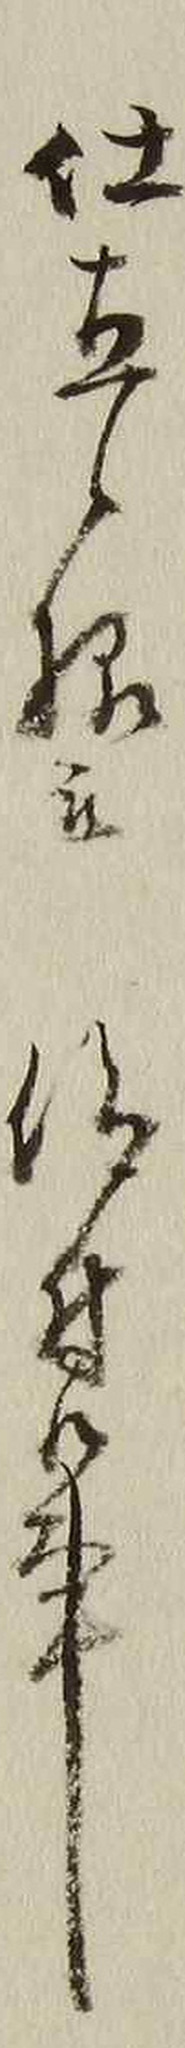仕立候様被仰付候事
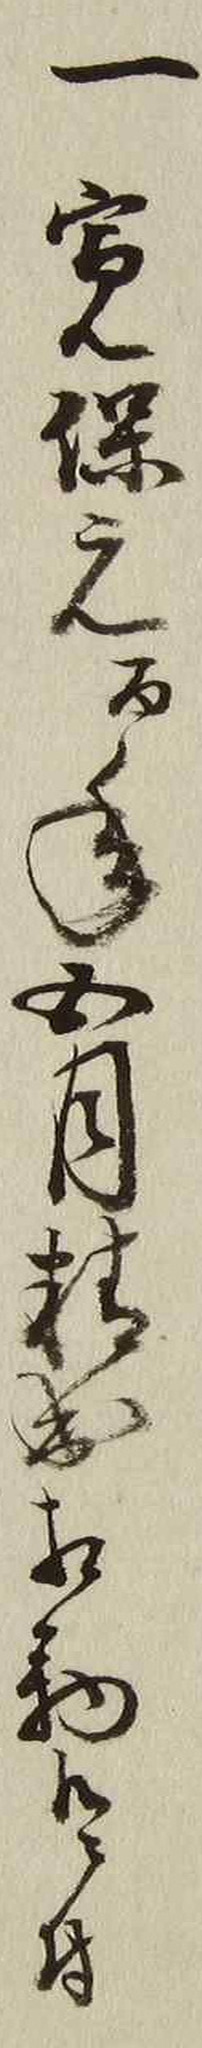一寛保元酉年五月精出相勤候ニ付
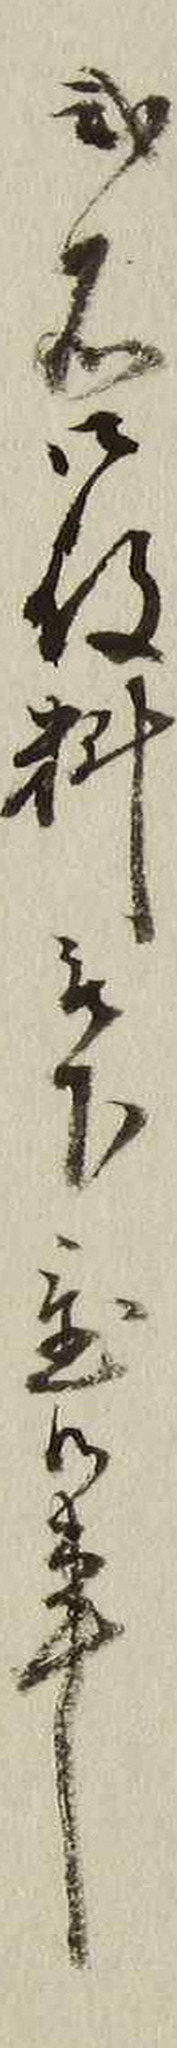弐石御役料被下置候事
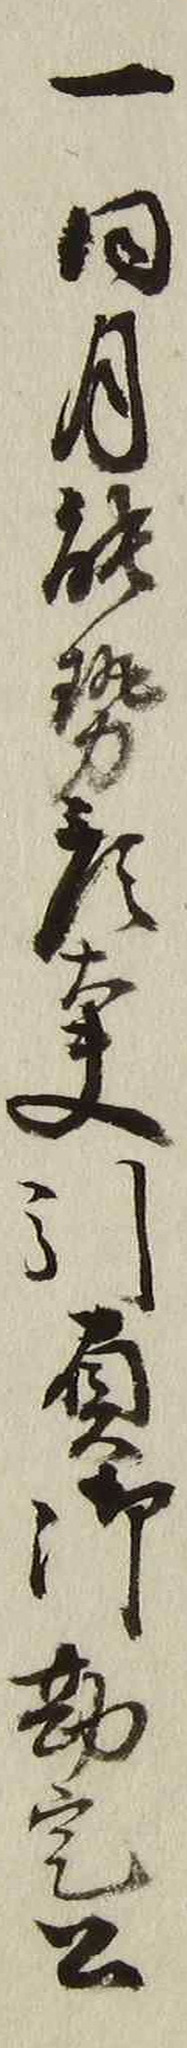一同月能勢彦大夫引負御勘定公
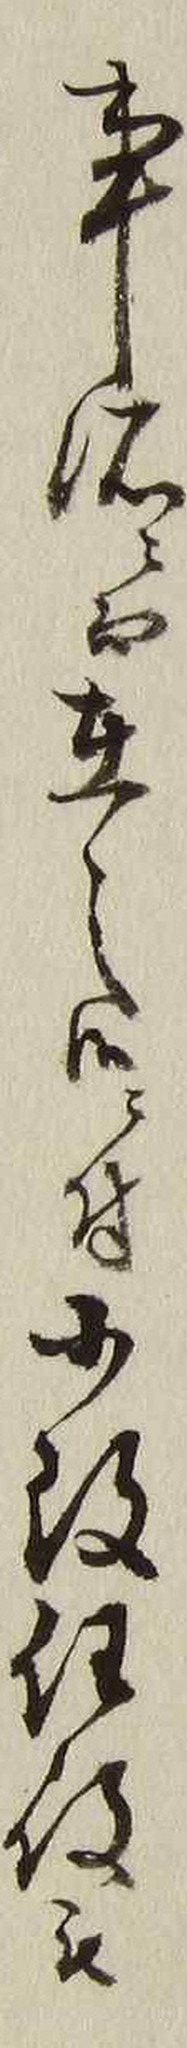事所ニ而在之候ニ付少改任役被
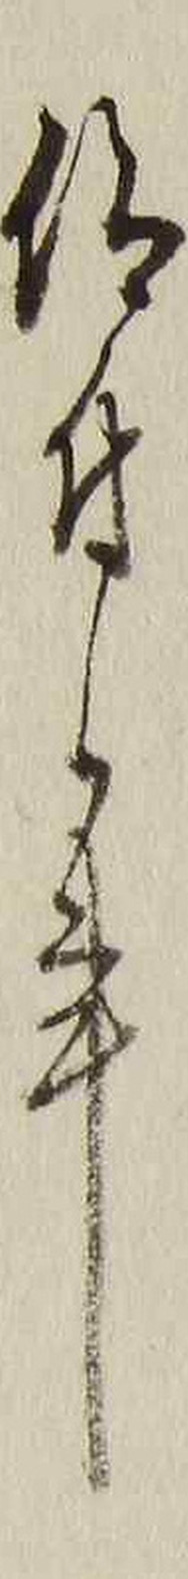仰付候事
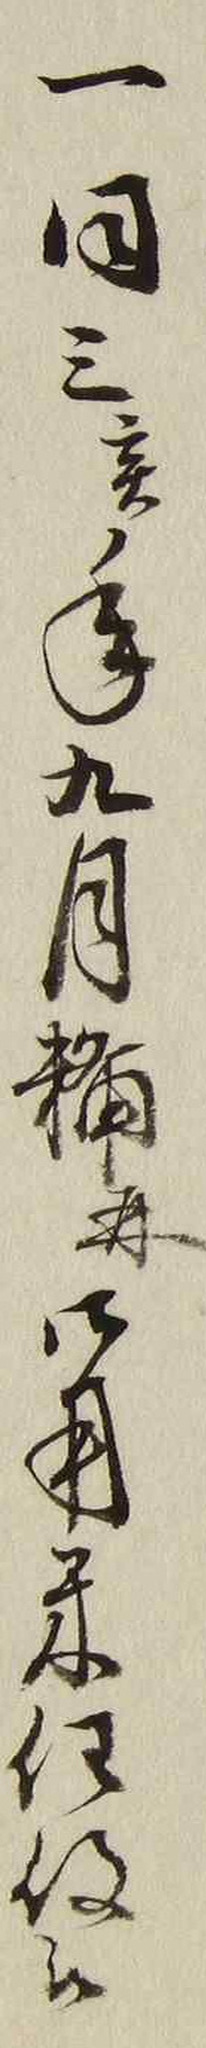一同三亥年九月糒并御用米任役被
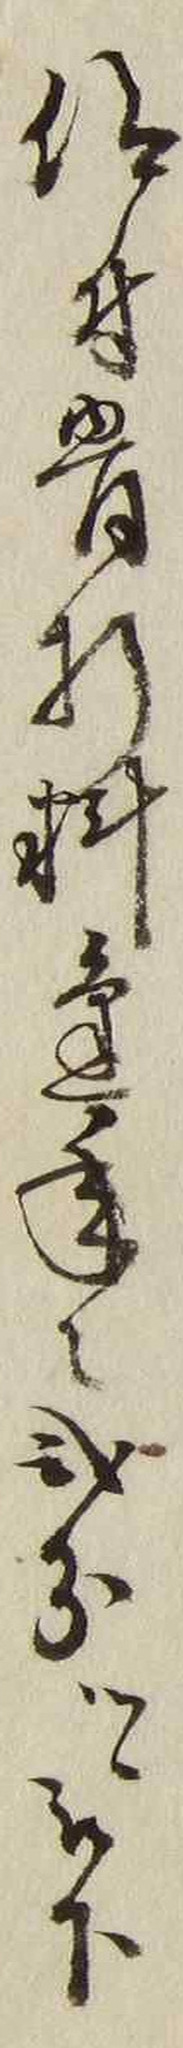仰付骨折料金年々弐分ツヽ被下

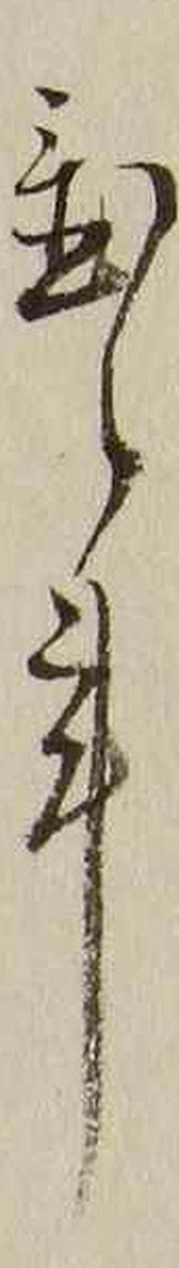置候事
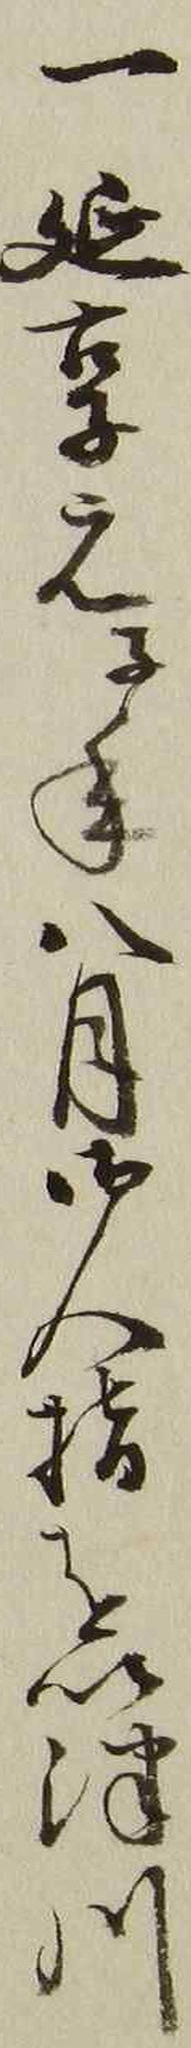一延享元子年八月御人指を以津川
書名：諸士系譜　巻之36　は之部4
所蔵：会津若松市立会津図書館
